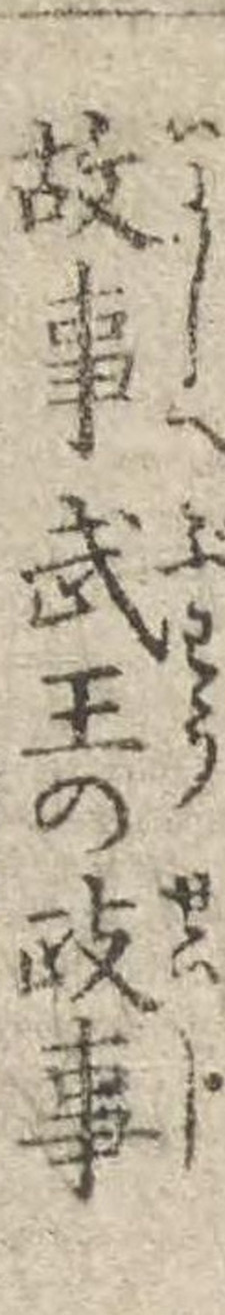故事武王の政事
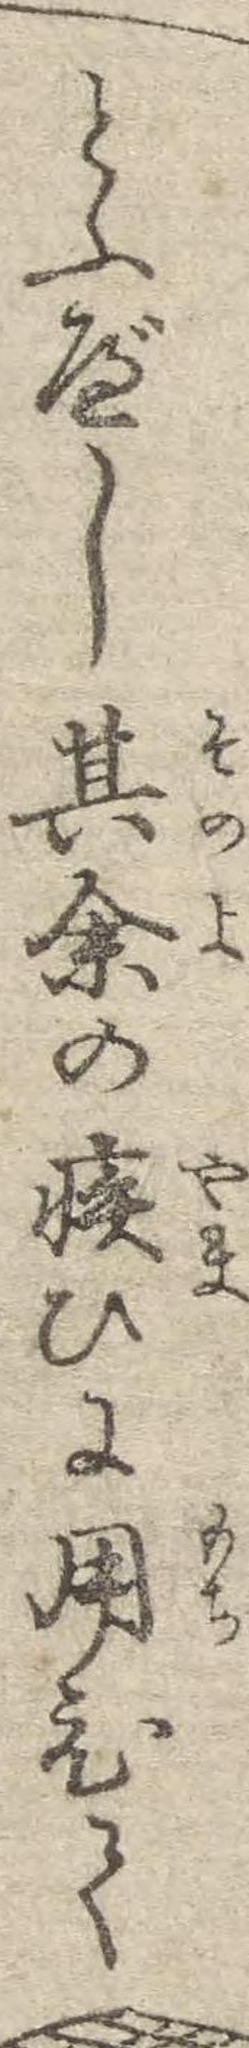とふべし其余の疾ひに用ひて
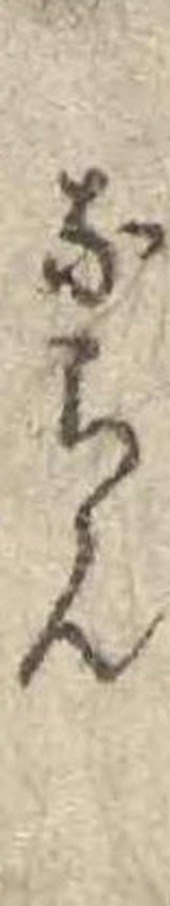ならん
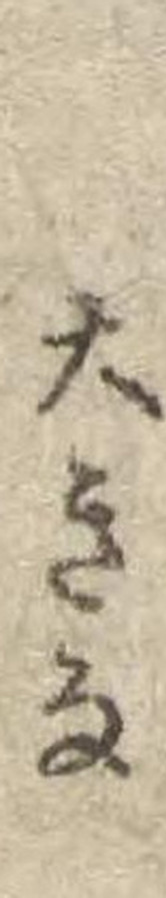大きな
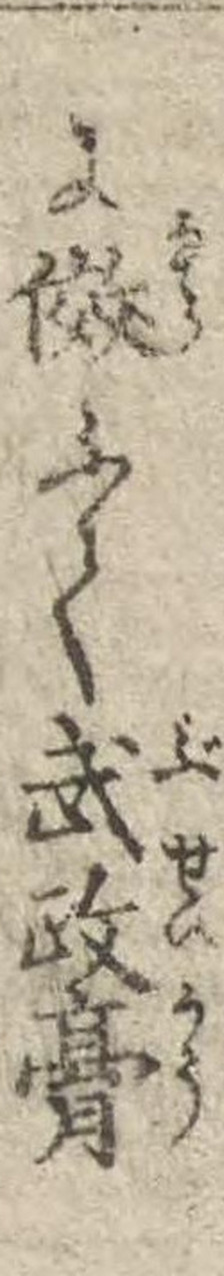に傚ふて武政膏
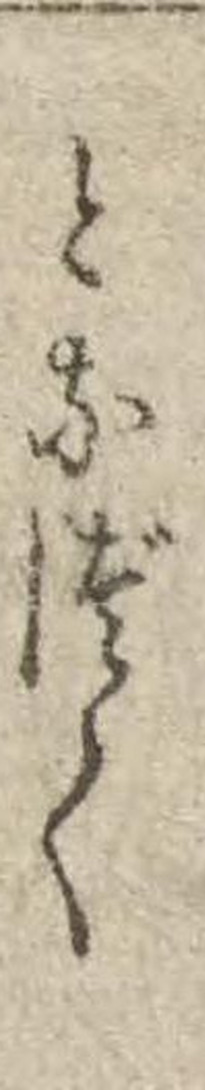となづく
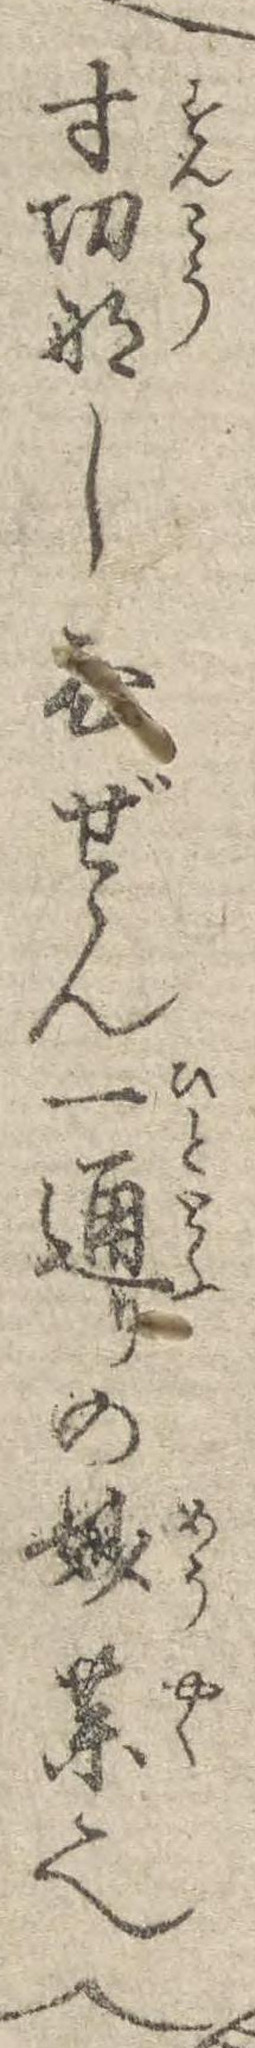寸功なしひぜん一通りの妙薬也

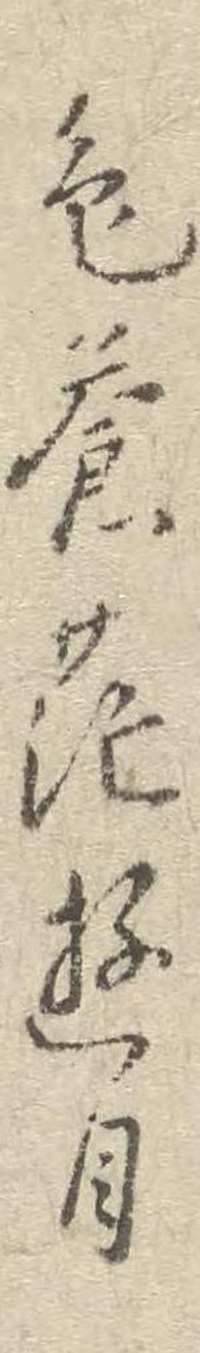色蒼茫遊目
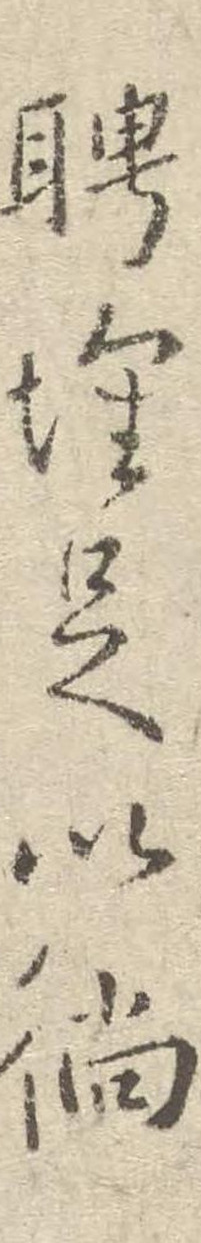聘埋足以徜
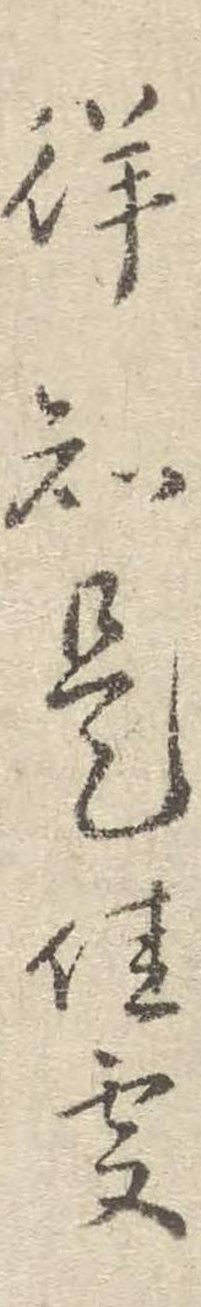詳知是佳処
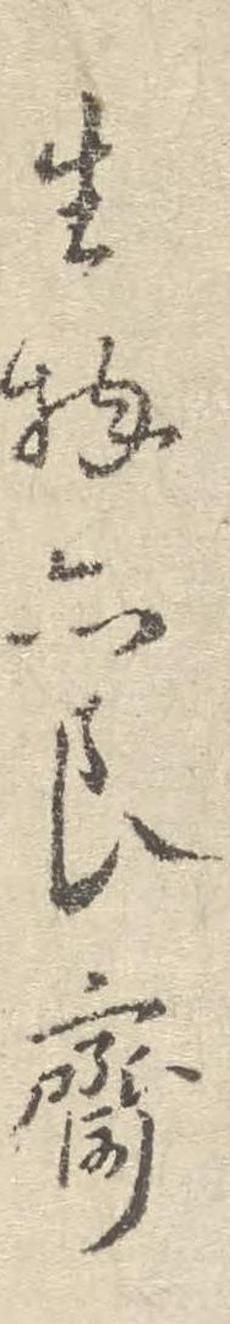生物亦良斎
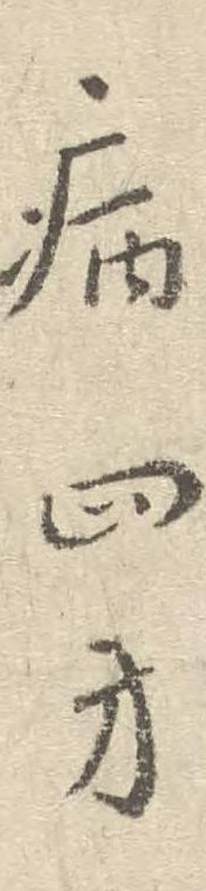病四方
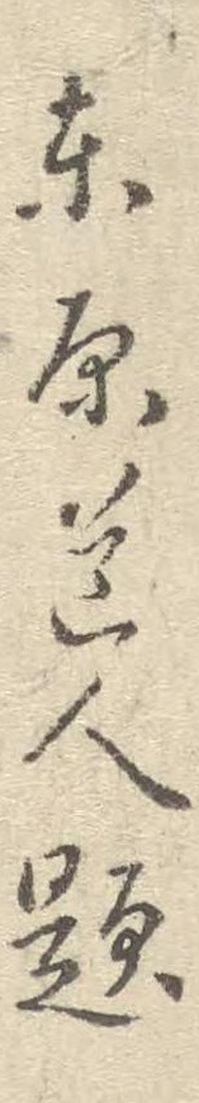東原道人題
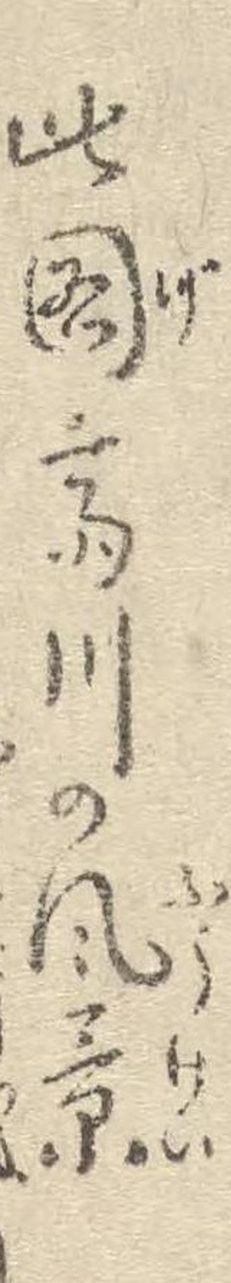此図斎川の風景
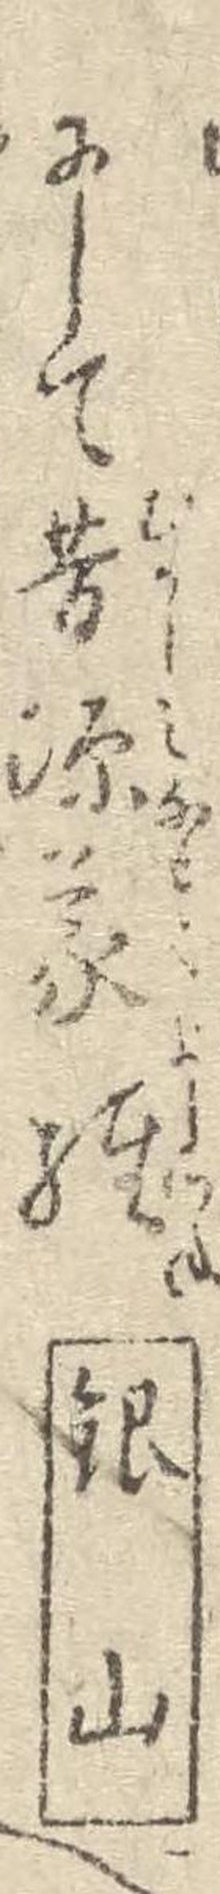にして昔源義経
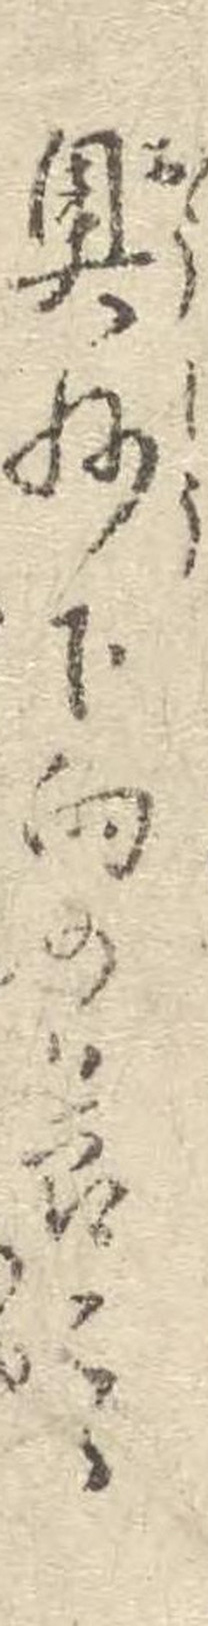奥州下向の節こゝ
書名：浪華薬種問屋能書張交帖. 一
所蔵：国立国会図書館 National Diet Library, JAPAN
